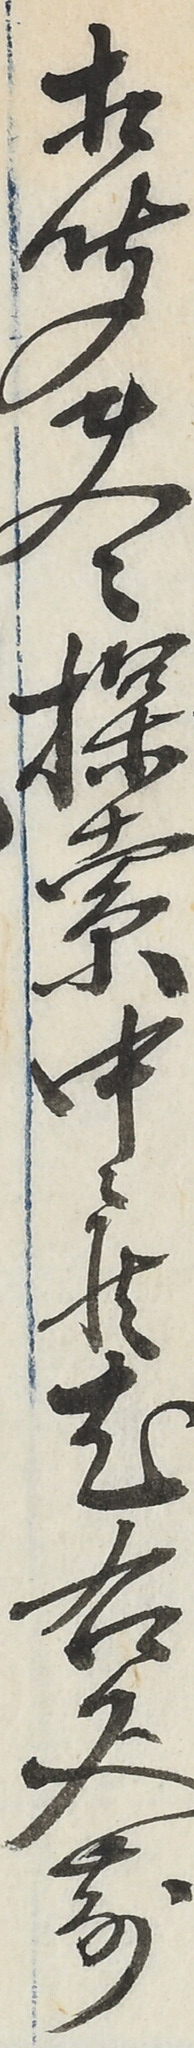相聞夫々探索中ニ候尤右人寄
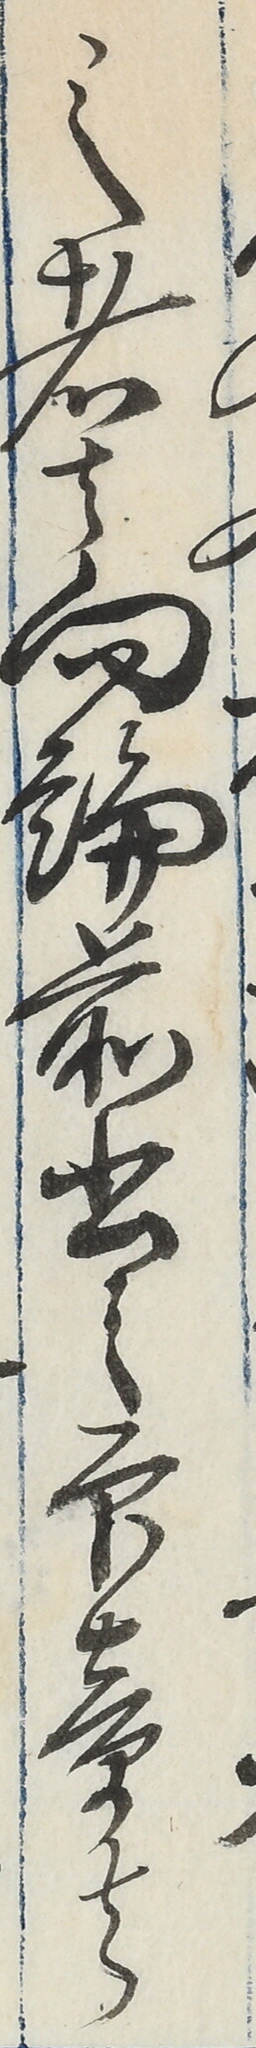之者者勿論前書之印章者
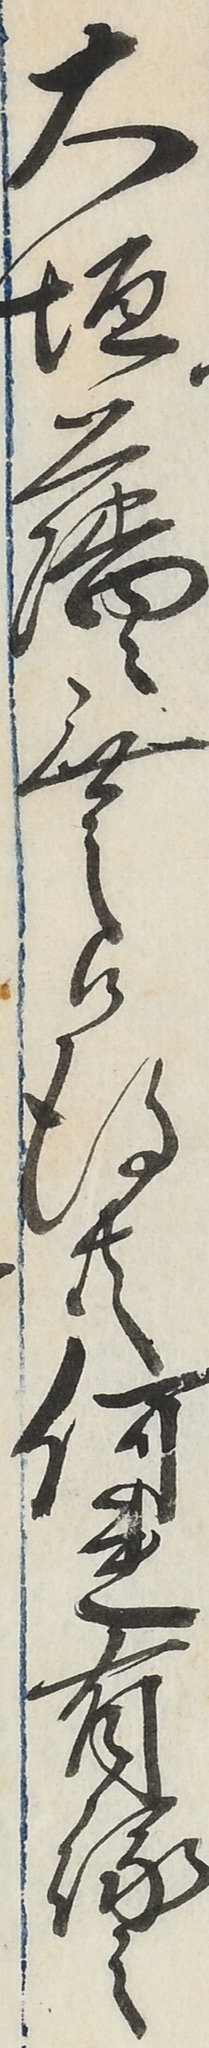大垣藩ニ無之候得共何れ有縁之
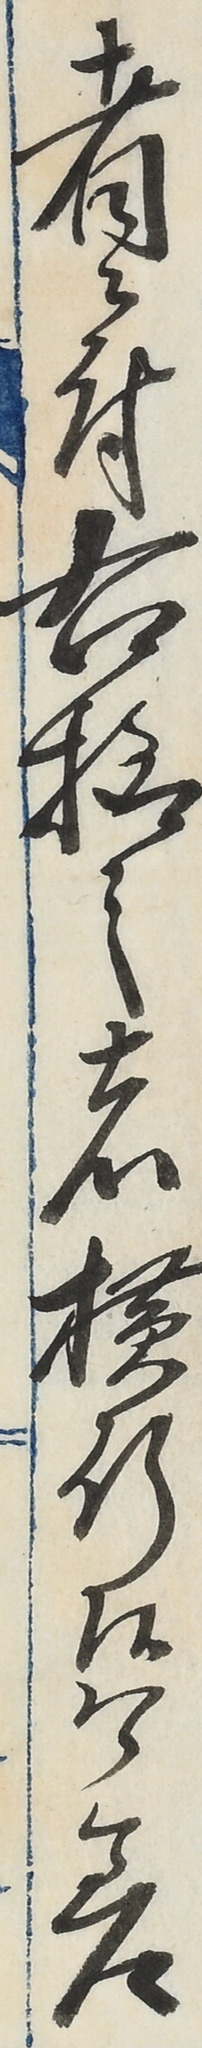者ニ付右様之者横行候ハゝ差

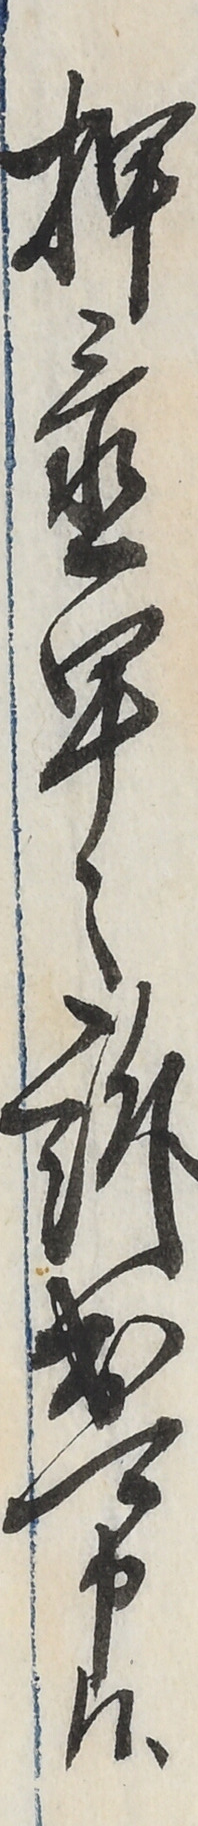押置早々訴出可申候
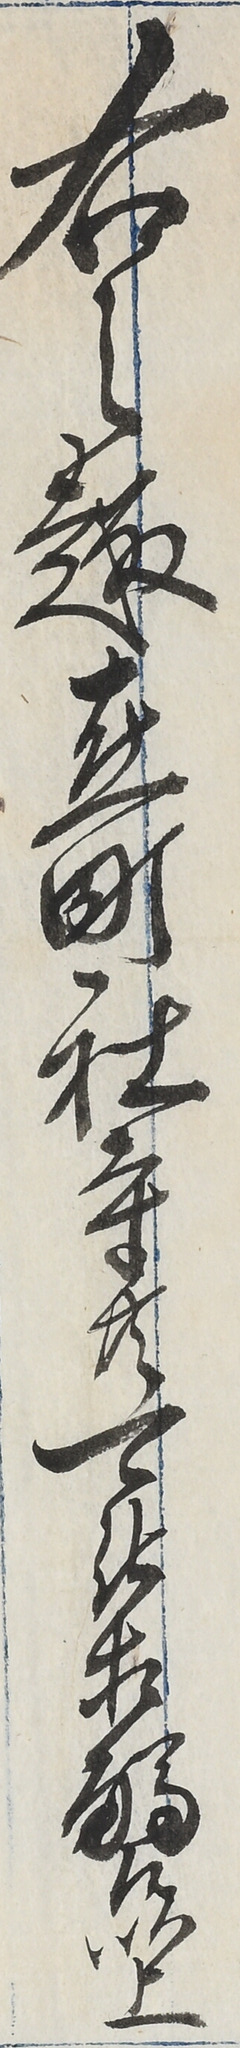右之趣在町社寺共可被相触候以上
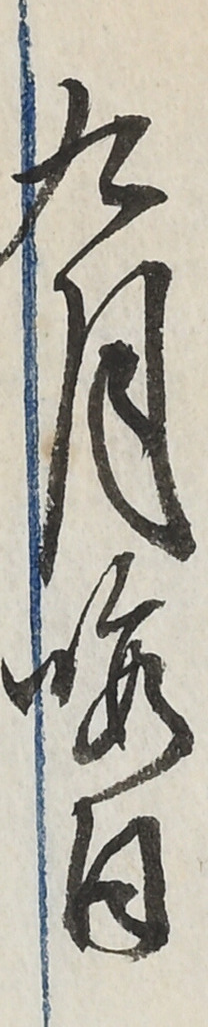九月晦日
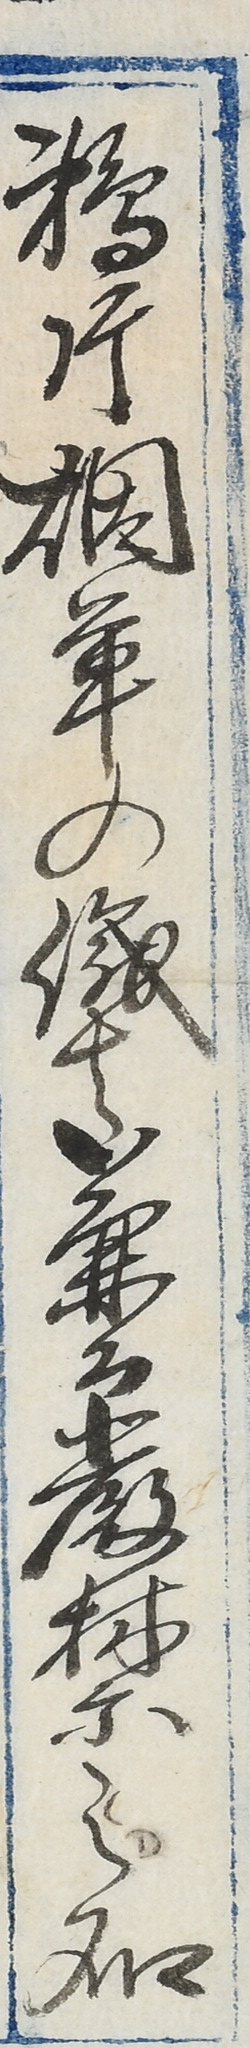一鴉片煙草の儀者兼而厳禁之処
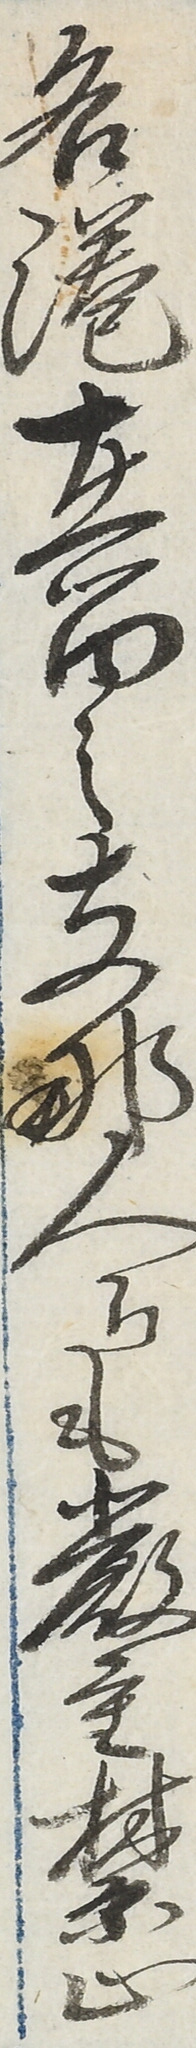各港在留之支那人江も厳重禁止
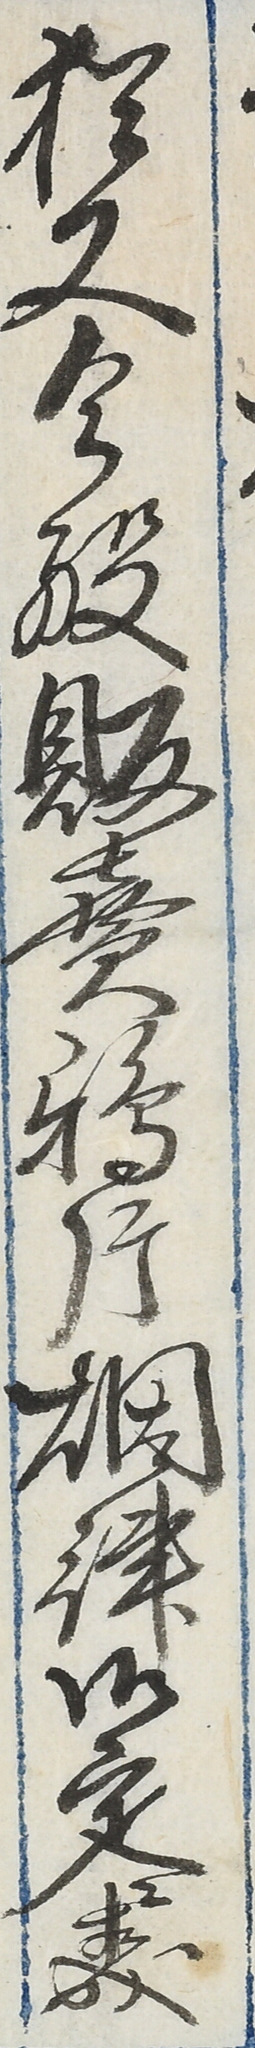猶又今般販売鴉片煙律御定ニ相成
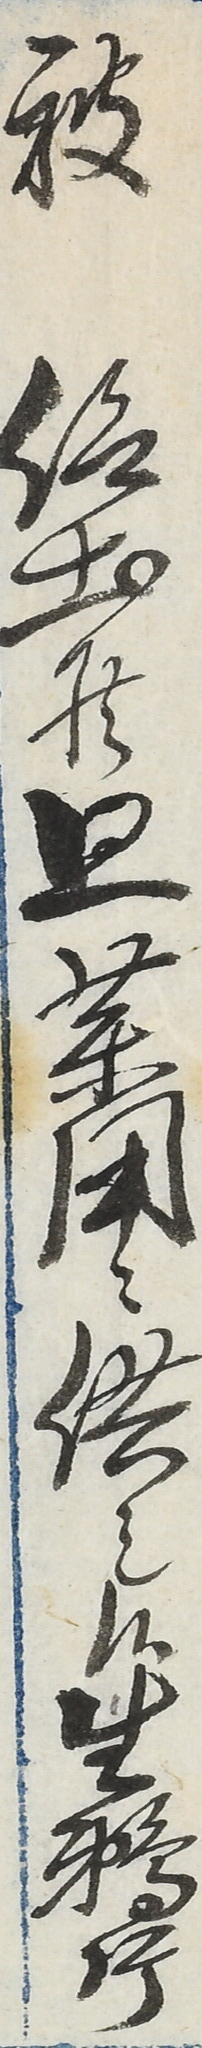被仰出候且薬用二供シ候生鴉片
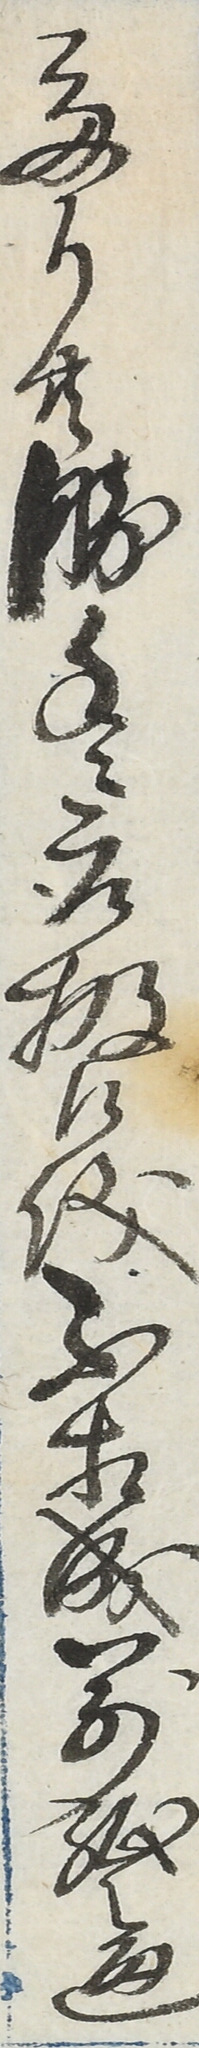たり共勝手ニ取扱候儀不相成別紙之通
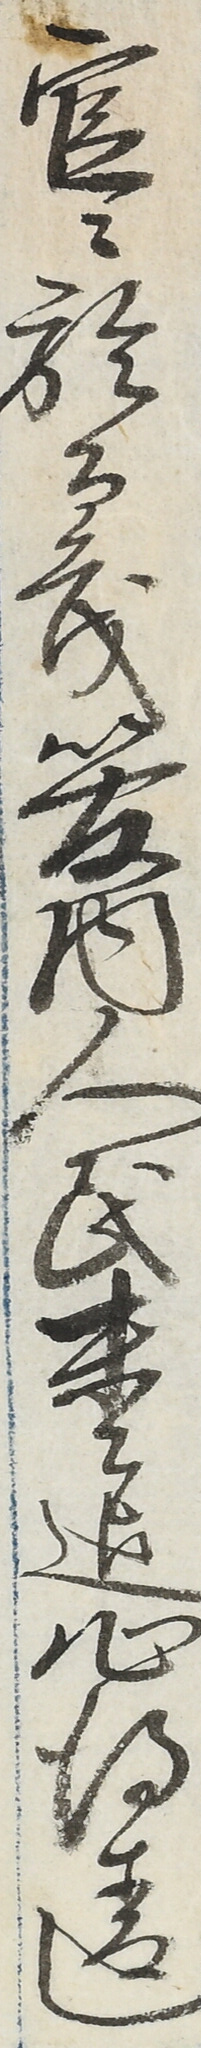官ニ於而茂管内人民末々迄心得違
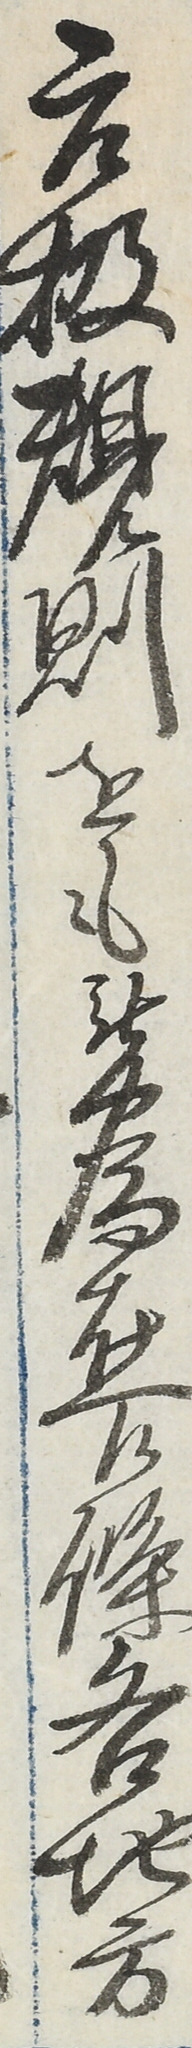元扱規則をも被為在候條各地方
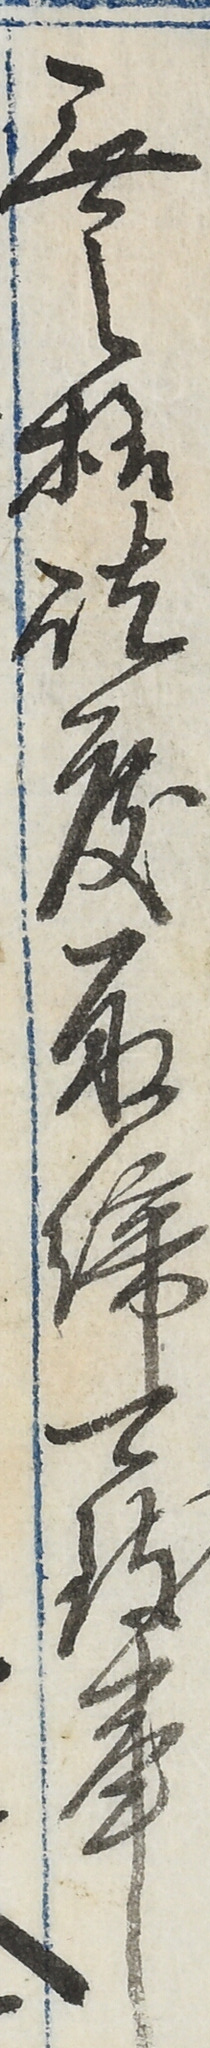無之様屹度取締可致事
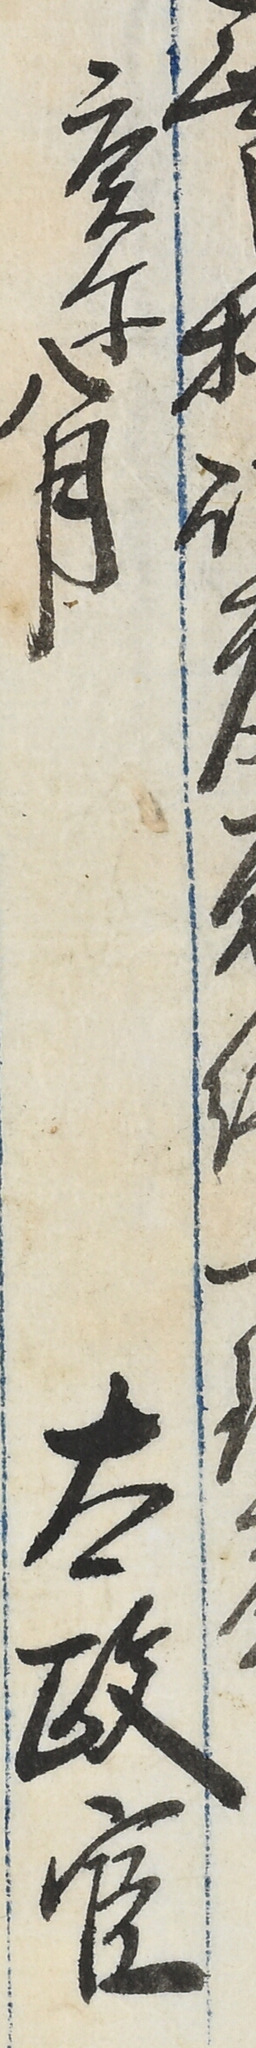庚午八月太政官
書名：布達書留
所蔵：伊那市立高遠町図書館・合同会社AMANE
